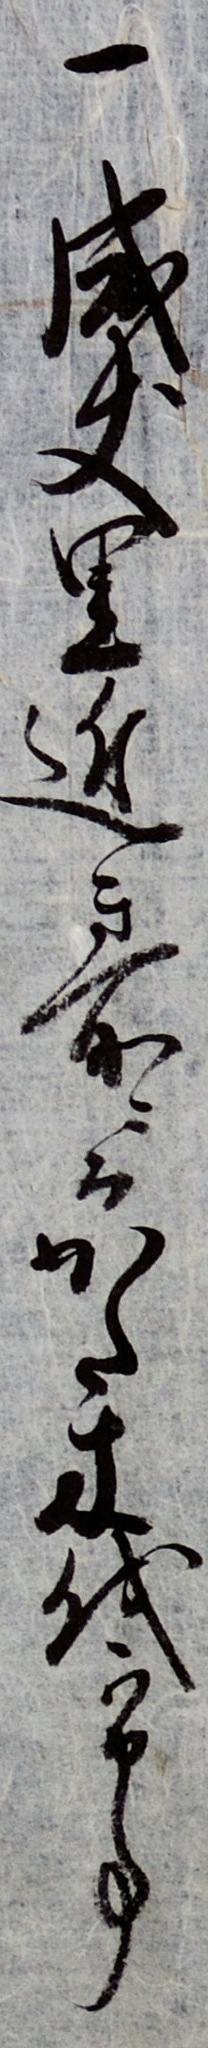一成丈里近き所ニ而かた木伐可申事
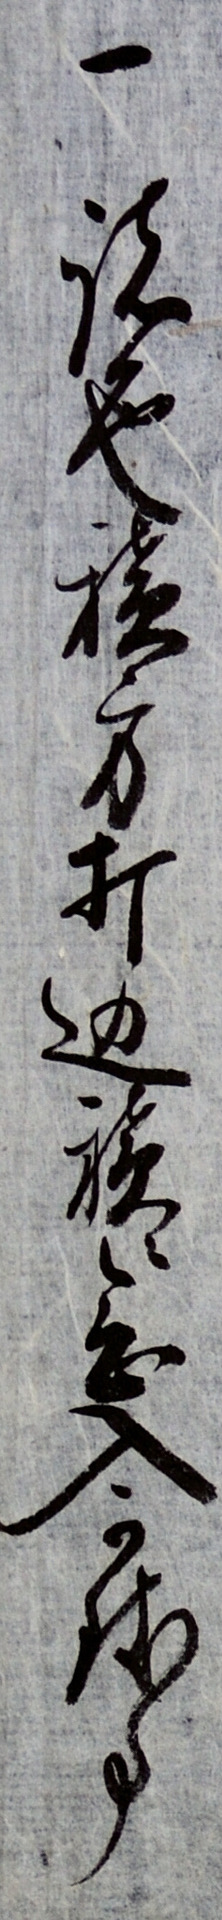一諸色積方打辺積ニ念入可致事
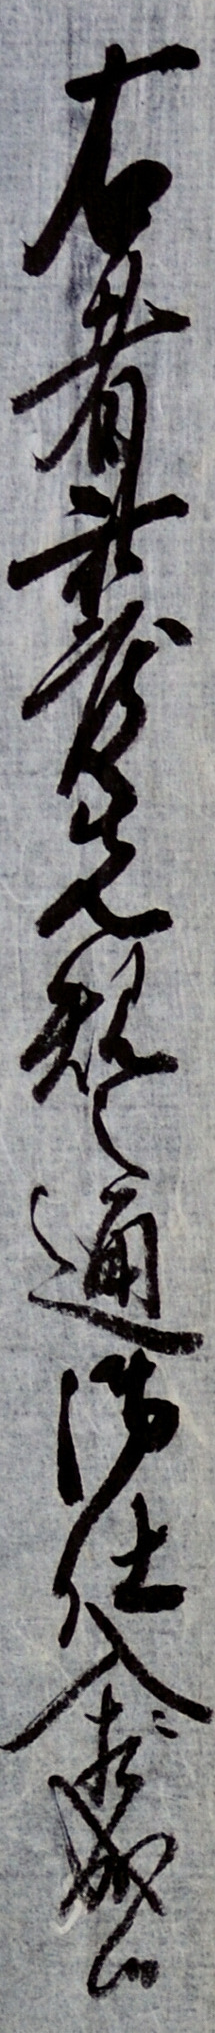右者此度先規之通御仕入ニ相成候
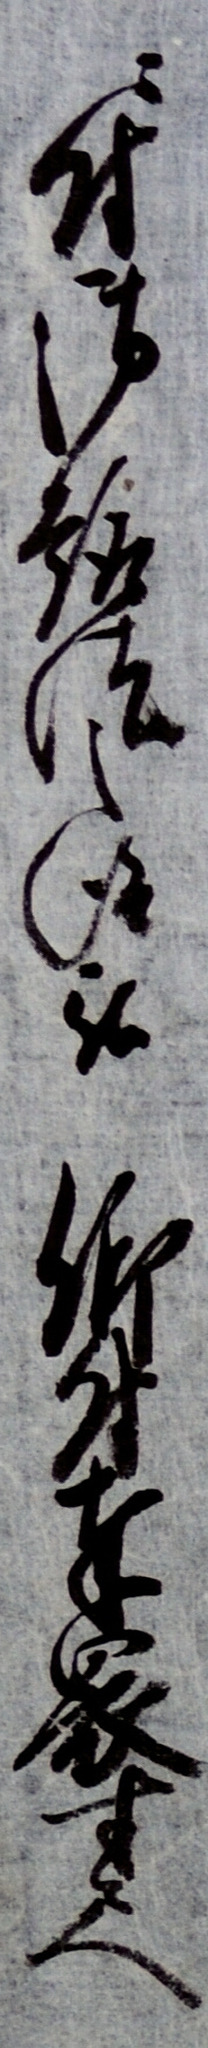ニ付御趣法之儀被仰付奉畏寸尺
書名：薪方役所宛諸請書等・一括
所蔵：伊那市立高遠町図書館・合同会社AMANE
